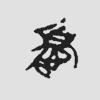{憂虫}
